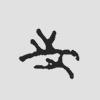寺
